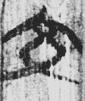交
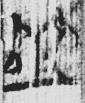○（地）
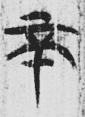不
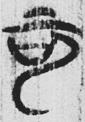可
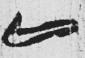㠯
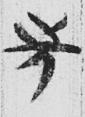先
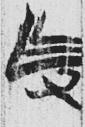拃（作）
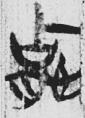○（怨）
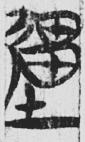疆
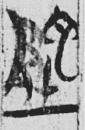○（地）
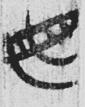母
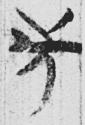先
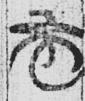而
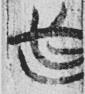必
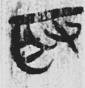取
